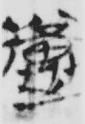○（畢）
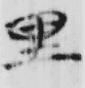里
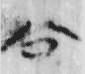公
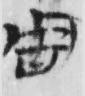周
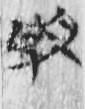受
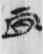○（期）
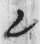乙
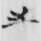之
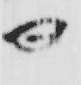日
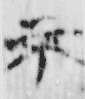不
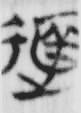𬨭（將）
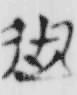○（卜）
